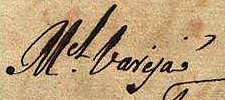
M.el Varejaõ
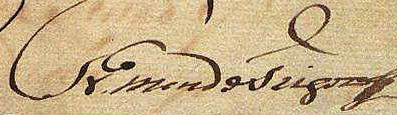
Fr.co mendo Trigozo
